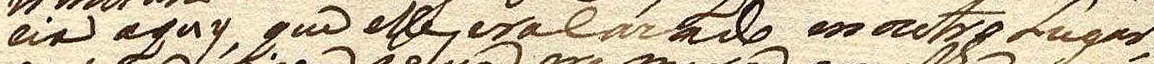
cia aquy, que elle era cazado en outro Lugar,
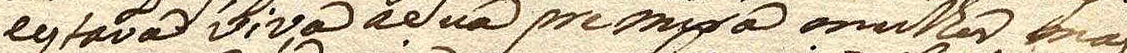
e estava viva a sua premera mulher, mas
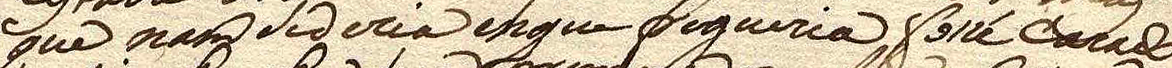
que nam sedezia en que freguezia fosse cazado
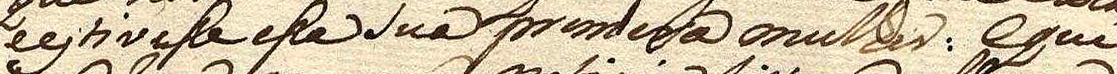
e estivesse ella sua primera mulher: e que
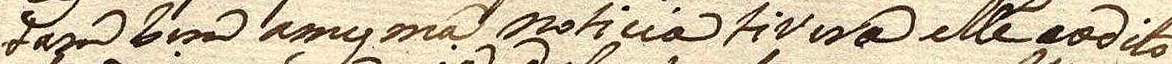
tambem a mesma noticia tivera elle ao dito
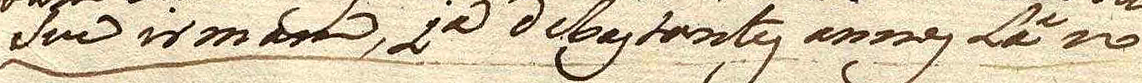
seu irmam, ja de bastantes annos Lá no
